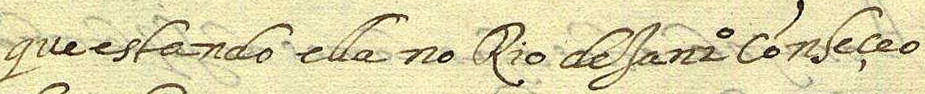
que estando ella no Rio de Janro cōnheçeo
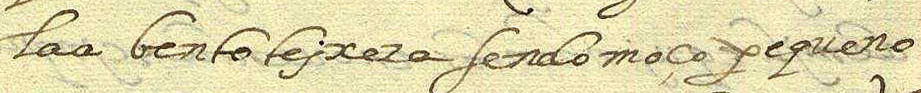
laa bento tejxera sendo moço pequeno
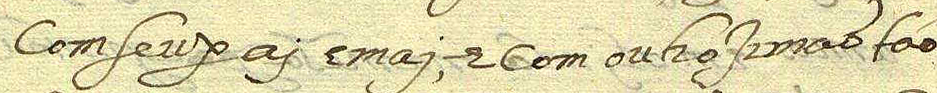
com seu paj E maj, E com outro Jrmaõ taõ
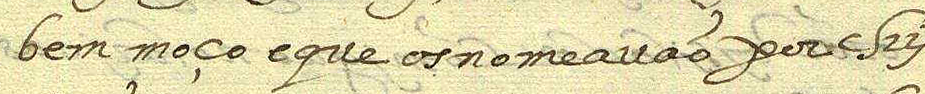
bem moço e que os nomeauaõ por chri
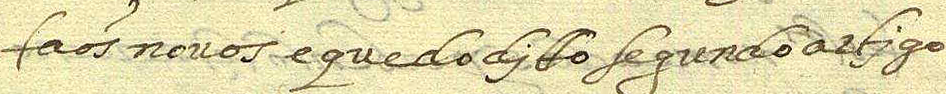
taõs nouos e que do djtto segundo artjgo
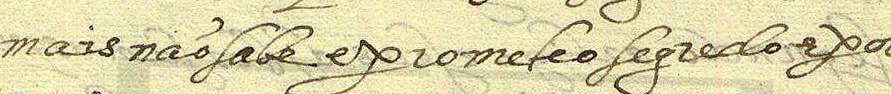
mais naõ sabe e prometeo segredo E por
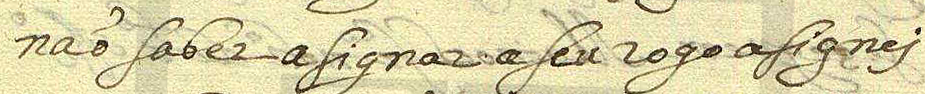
naõ saber assignar a seu rogo assignej
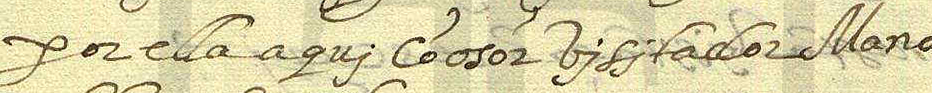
por ella aquj cō o sor̄ vjsjtador Mano
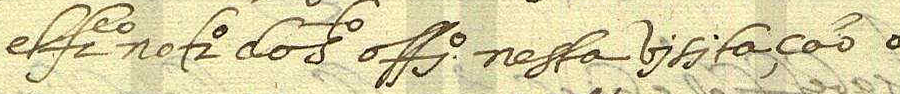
el frco notro do sto offjo nesta vjsjtaçaõ o
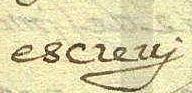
escreuj
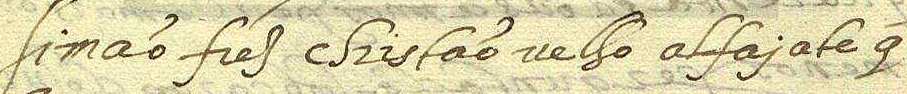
Simão frez̄ christaõ uelho alfajate q̄
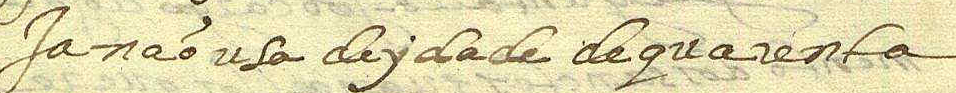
Ja naõ usa de ydade de quarenta
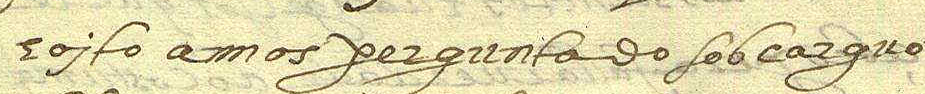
E ojto annos perguntado sob carguo
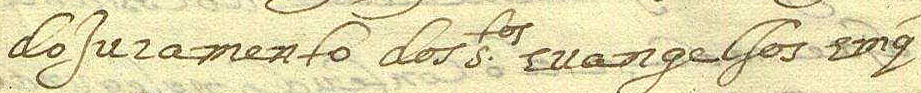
do Juramento dos s.tos Euangelhos Em q̄
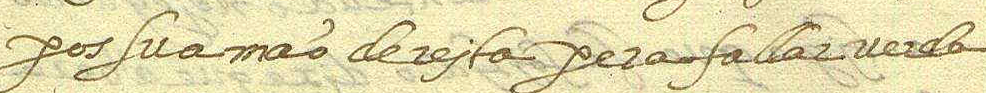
pos sua maõ derejta pera fallar uerda
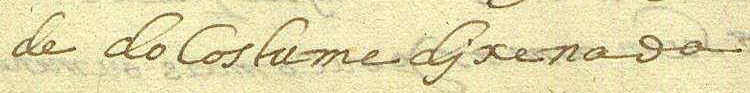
de do Costume djxe nada
